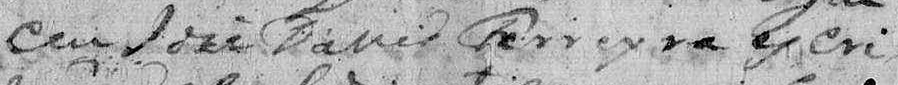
e eu Ioze David Ferreyra escri
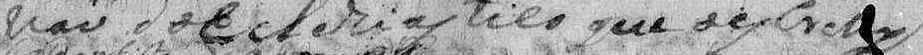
vaõ do Ecleziastico que o escrevy
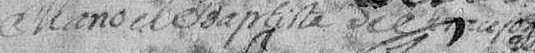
Manoel Baptista de Araujo
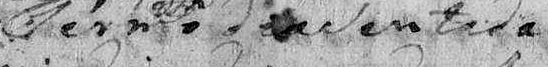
Termo de asentada
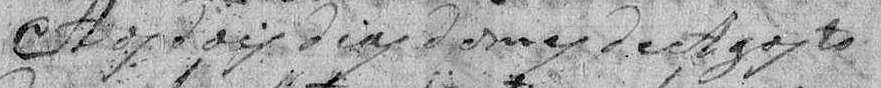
Aos dois dias do mes de Agosto
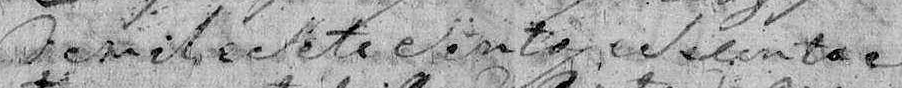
de mil e setesentos e secenta e
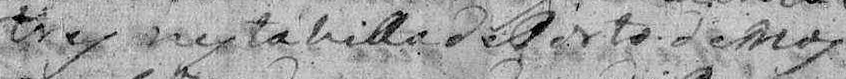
tres nesta villa de Porto de Mos
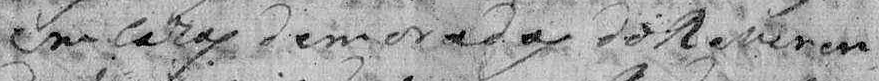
em cazas de moradas do Reveren
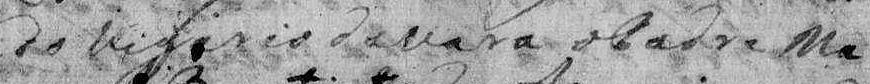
do vigario da vara o Padre Ma
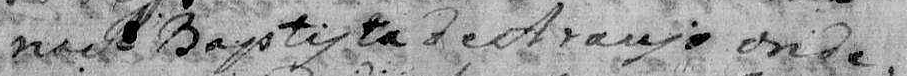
noel Baptista de Araujo onde
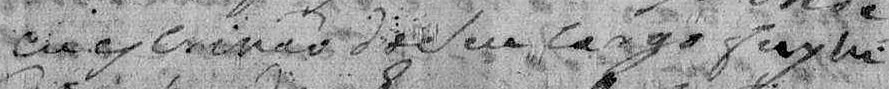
eu escriuaõ de seu Cargo fuy vī
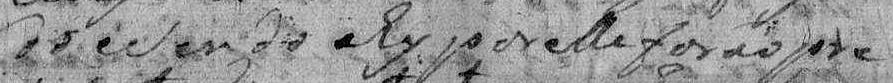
do e sendo ahy por elle foraõ pre
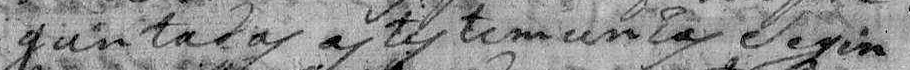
guntadas as testemunhas segin
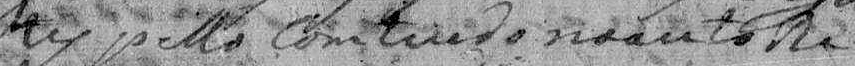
tes pello Comteudo no auto Re
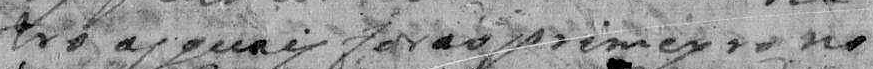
tro as quais foraõ primeyro no
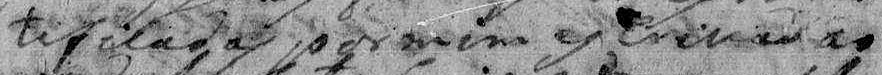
tificadas por mim esCriuão ao
